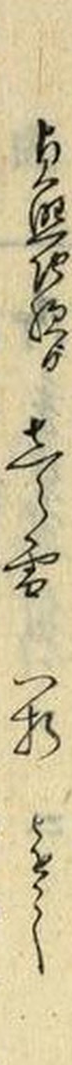貞照院様ゟしら雪一折被進之
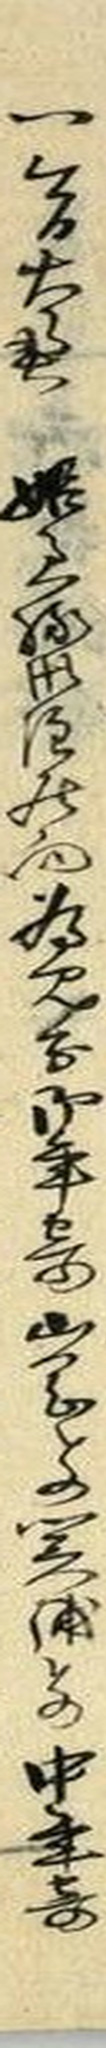一今日大奥姫君様御住居向為見分御年寄山岡との関浦との中年寄
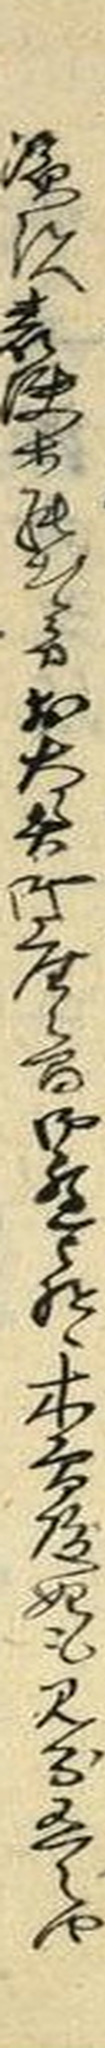浜沢表使等罷出候ニ付於大奥御座之間御逢被遊候木曽殿始も見分有之由
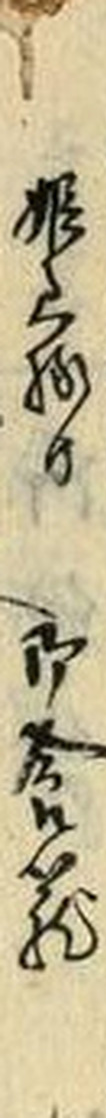姫君様ゟ御食籠
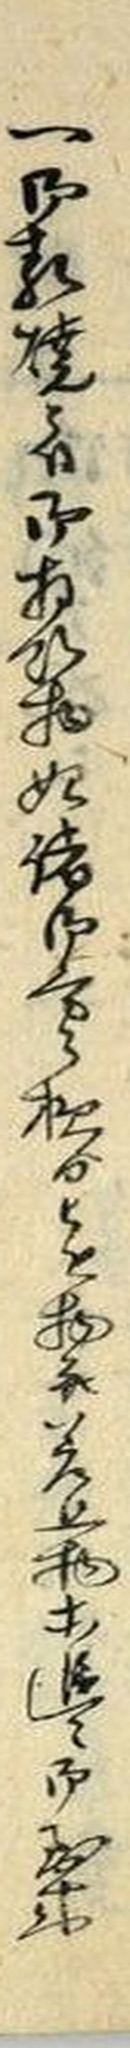一御類焼ニ付御拝領物始諸御方々様ゟ被進物并差上物等追々御到来
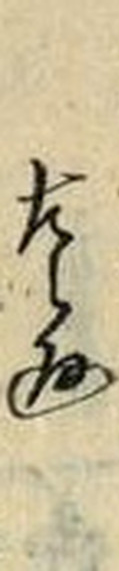左之通
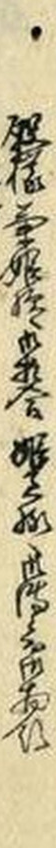殿様菊姫様へ御相合姫君様御伝ニ而御拝領
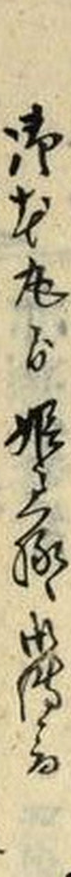御本丸ゟ姫君様へ御伝ニ而
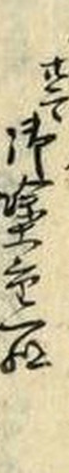御塗重一組
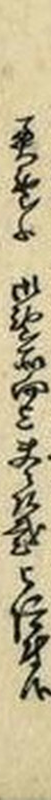奥台子御台所向迄夫々頂戴被仰付候

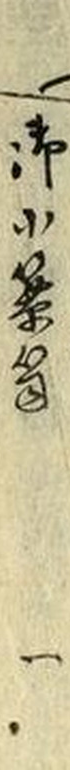御手箪笥一
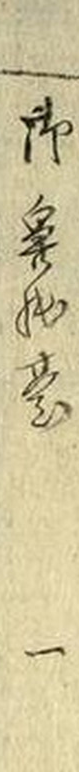御鼻紙台一
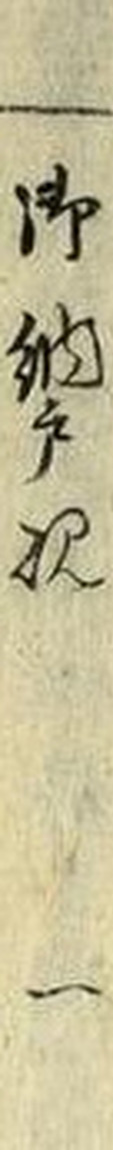御納戸硯一
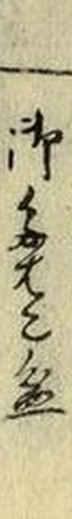御たはこ盆一
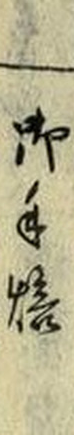御手焙一
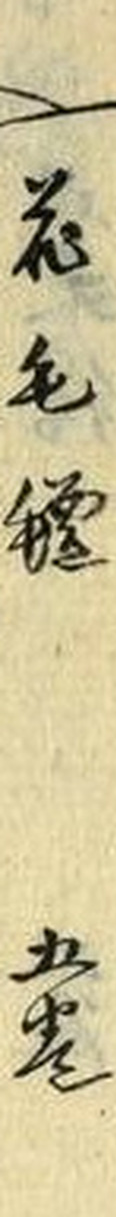花毛氈五巻
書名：少傅日録抄（斉承付側向頭取日記、在府）
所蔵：福井県文書館 Fukui Prefectural Archives
